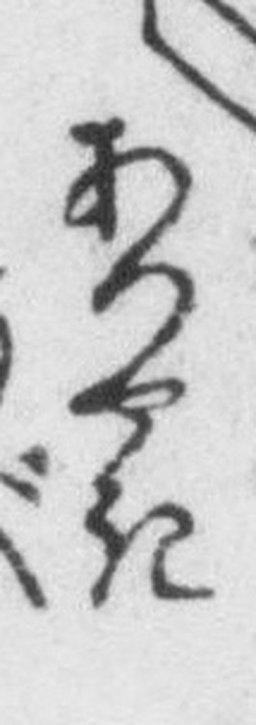あつやき
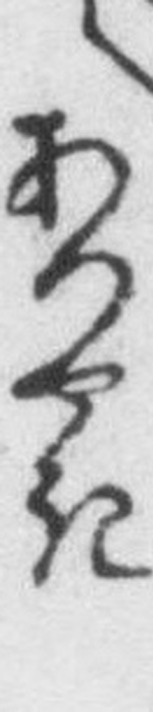あつやき
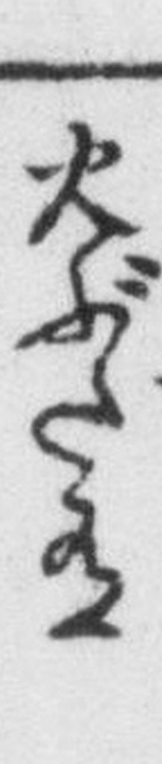火ぶた有
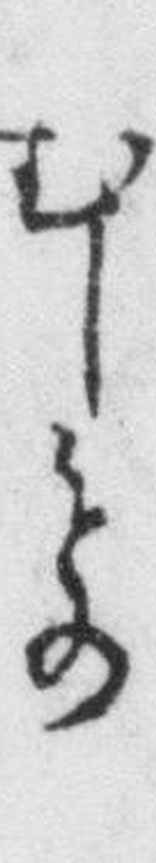むしもの
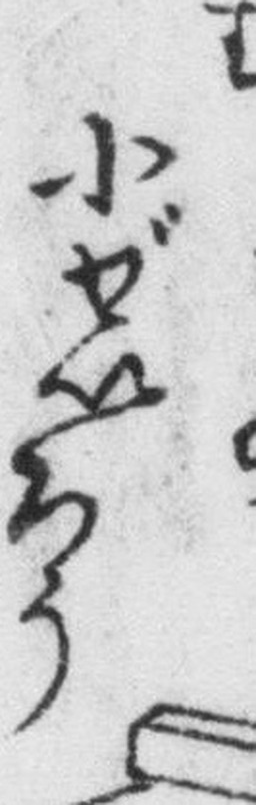小ぜいろう
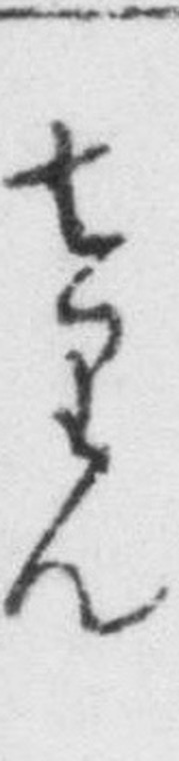七りん
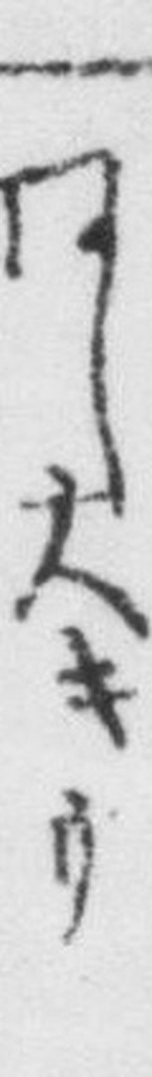同し大きさ
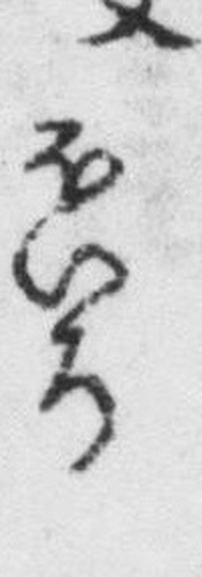ほいろ
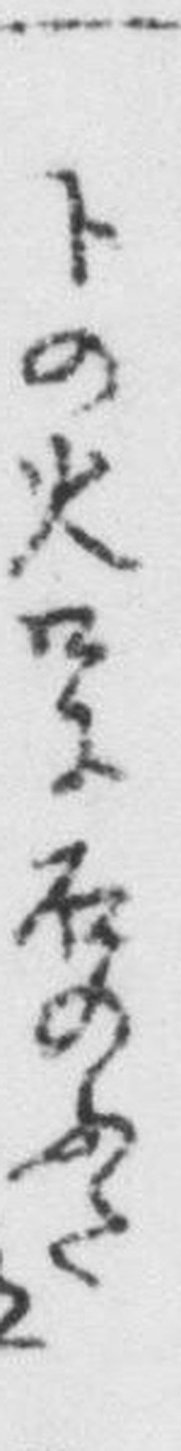下の口に石のふた有
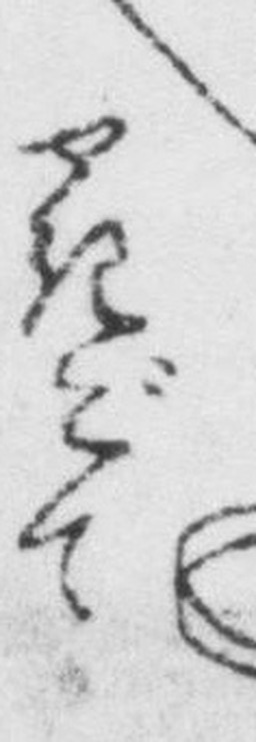やきごて
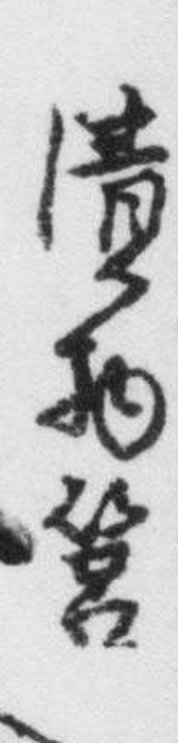漬物筥
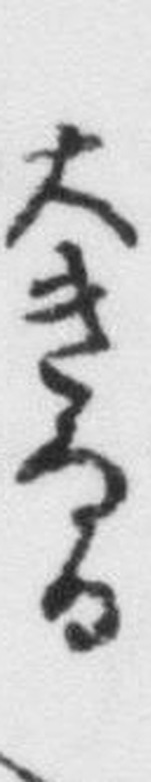大きなる
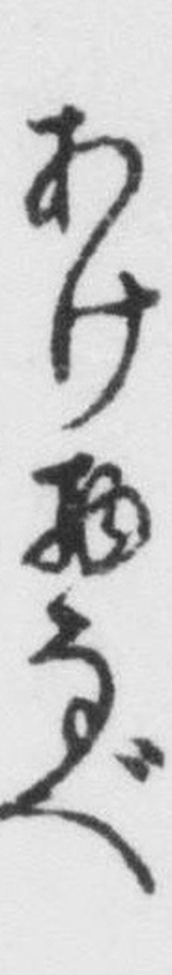あけ物なべ
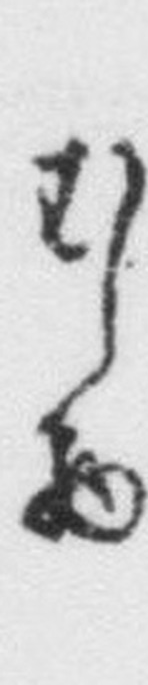むし物
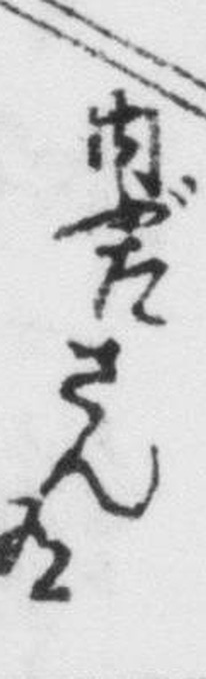内ぶたさん有
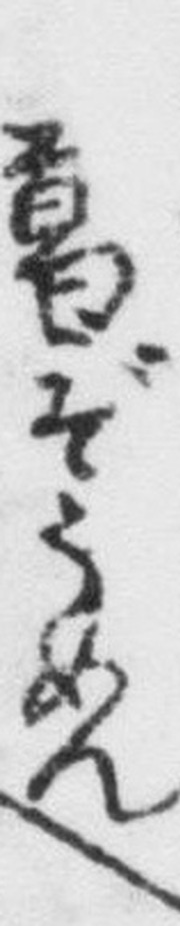葛ぞうめん
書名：料理早指南
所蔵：大阪府立大学学術情報センター 国文学研究資料館
